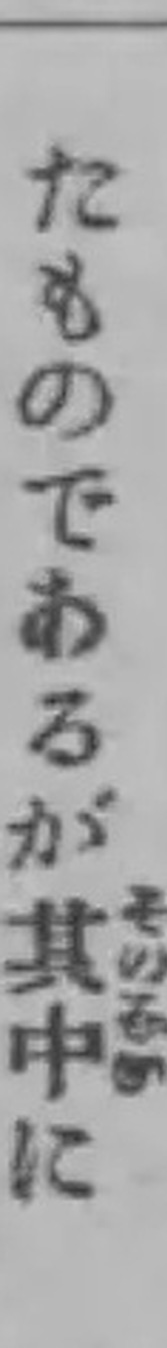たものであるが其中に
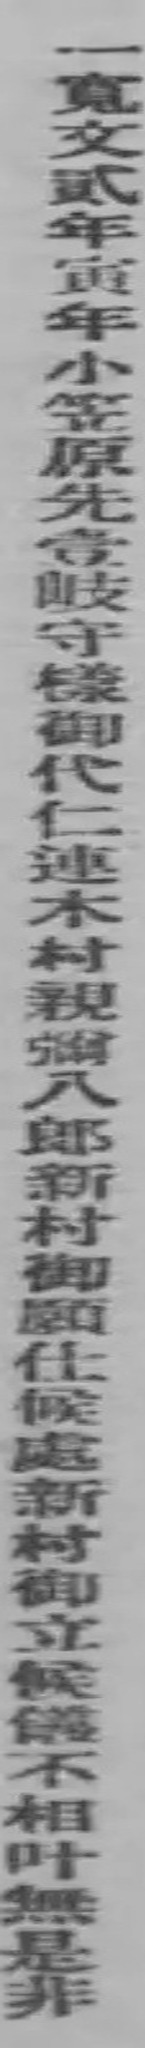一寛文弐年寅年小笠原先壱岐守様御代仁連木村親弥八郎新村御願仕候処新村御立候儀不相叶無是非
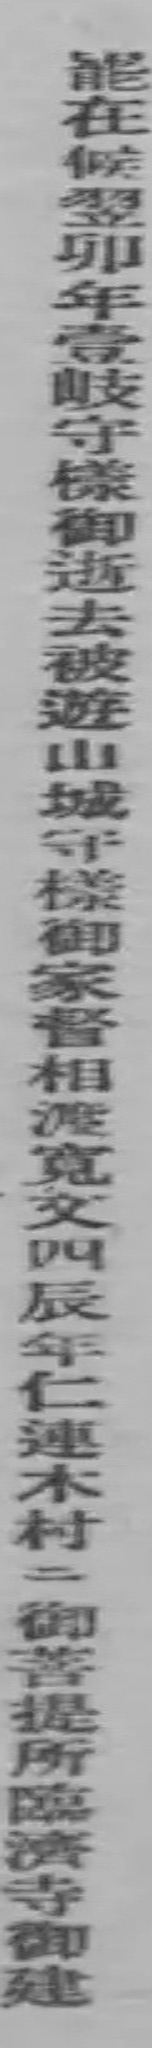罷在候翌卯年壱岐守様御逝去被遊山城守様御家督相渡寛文四辰年仁連木村ニ御菩提所臨済寺御建
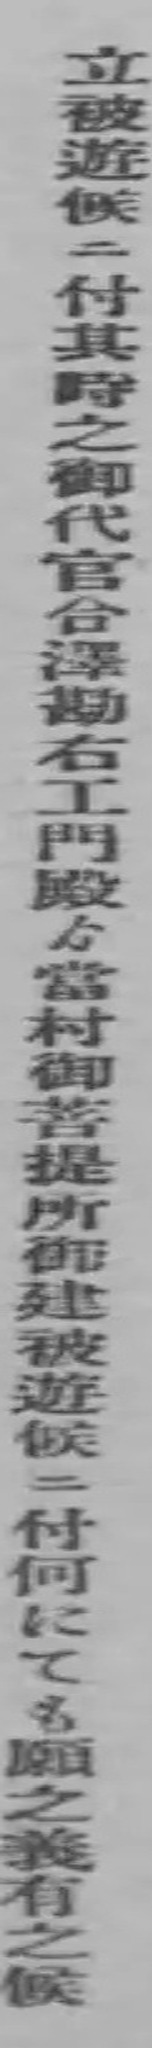立被遊候ニ付其時之御代官合澤勘右エ門殿ゟ当村御菩提所御建被遊候ニ付何にても願之義有之候
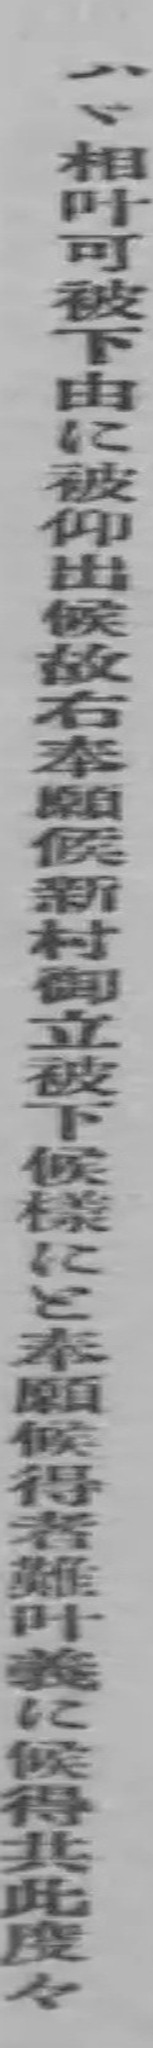ハヾ相叶可被下由に被仰出候故右奉願候新村御立被下候様にと奉願候得者難叶義に候得共此度々
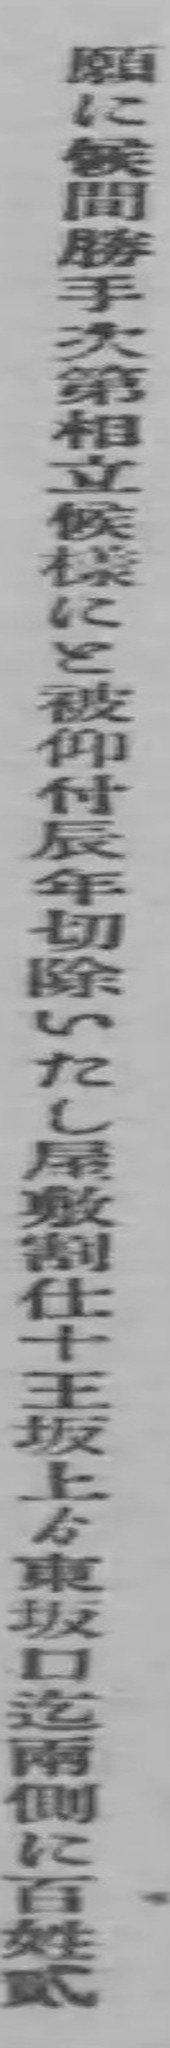願に候間勝手次第相立候様にと被仰付辰年切除いたし屋敷割仕十王坂上ゟ東坂口迄両側に百姓弐
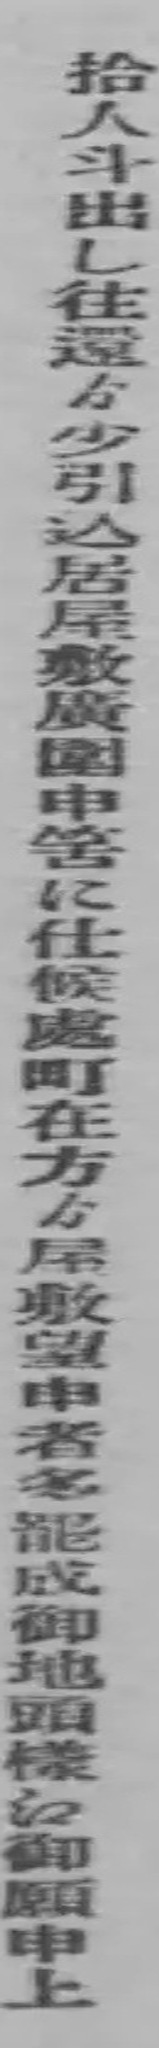拾人斗出し往還ゟ少引込居屋敷広囲申筈に仕候処町在方ゟ屋敷望申者多罷成御地頭様え御願申上
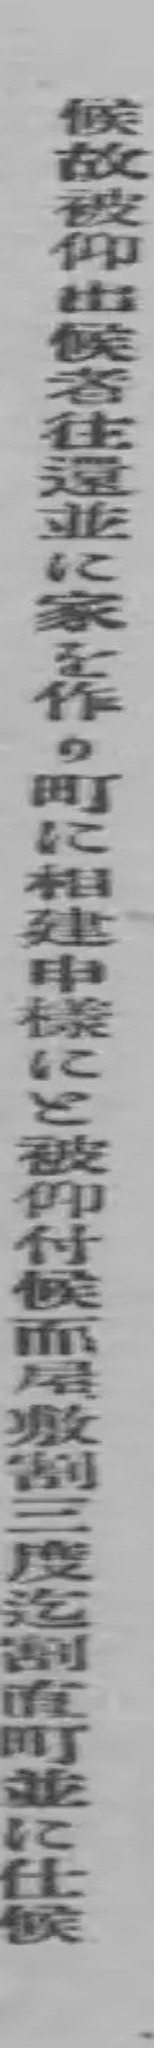候故被仰出候者往還並に家を作り町に相建申様にと被仰付候而屋敷割三度迄割直町並に仕候
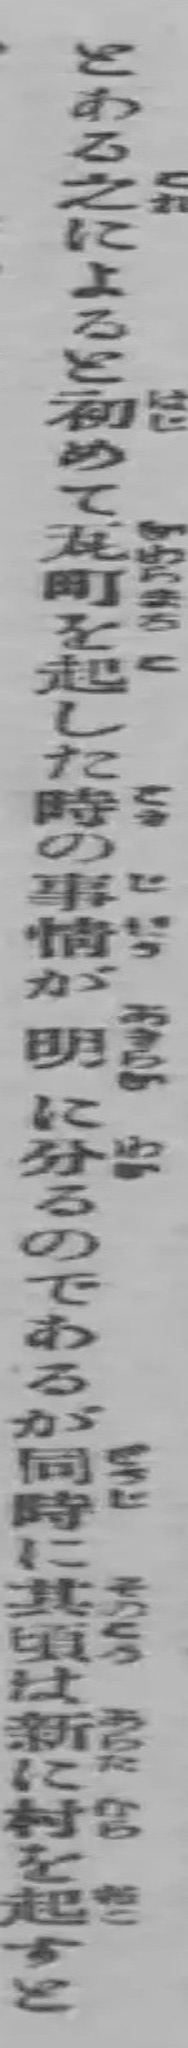とある之によると初めて瓦町を起こした時の事情が明に分るのであるが同時に其頃は新に村を起すと
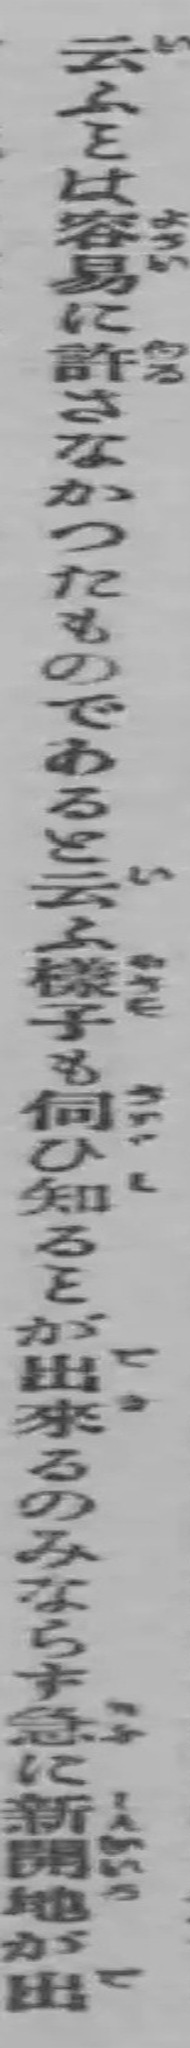云ふことは容易に許さなかつたものであると云ふ様子も伺ひ知ることが出来るのみならず急に新開地が出
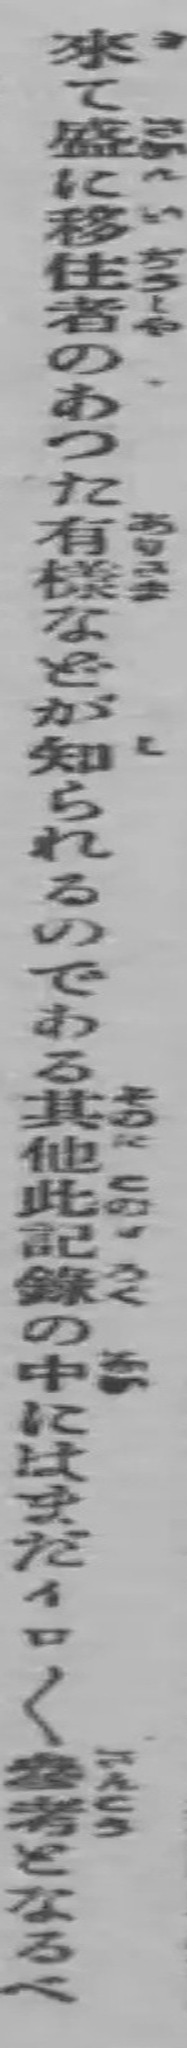来て盛に移住者のあつた有様などが知られるのである其他此記録の中にはまだイロ〳〵参考となるべ
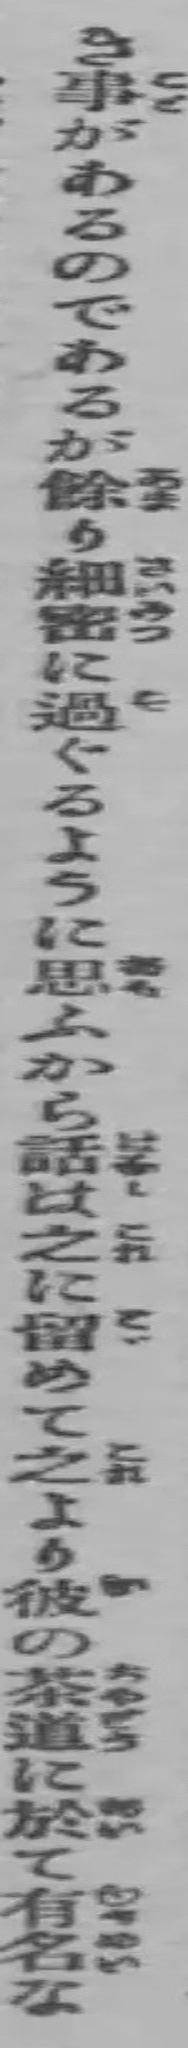き事があるのであるが余り細密に過ぐるように思ふから話は之に留めて之より彼の茶道に於て有名な
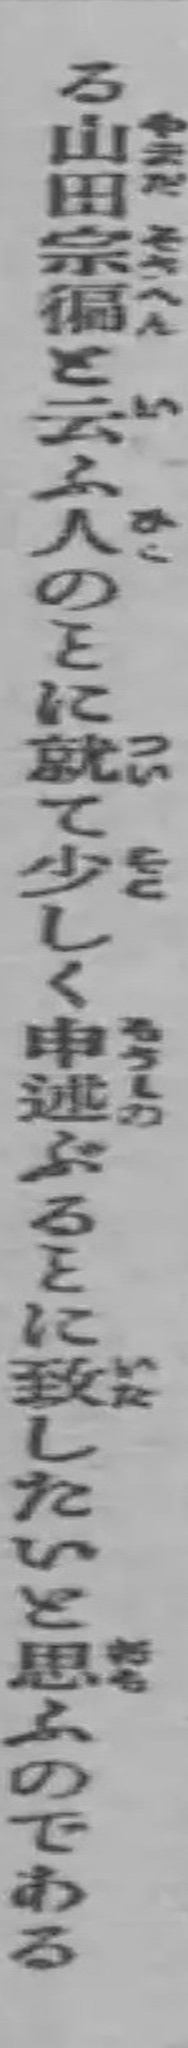る山田宗徧と云ふ人のことに就て少しく申述ぶることに致したいと思ふのである

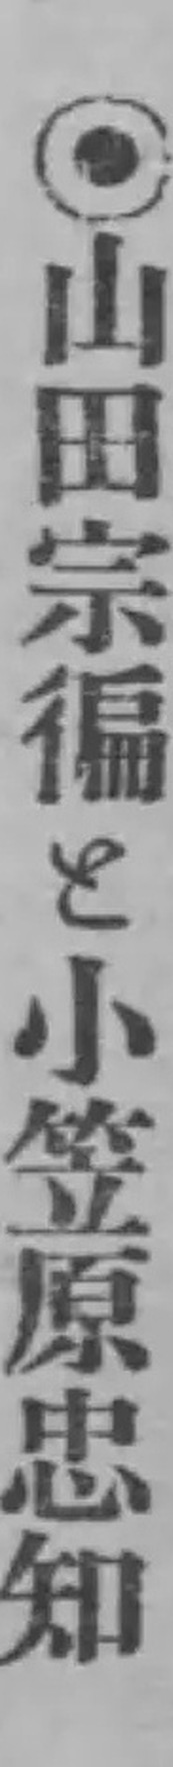⦿山田宗徧と小笠原忠知
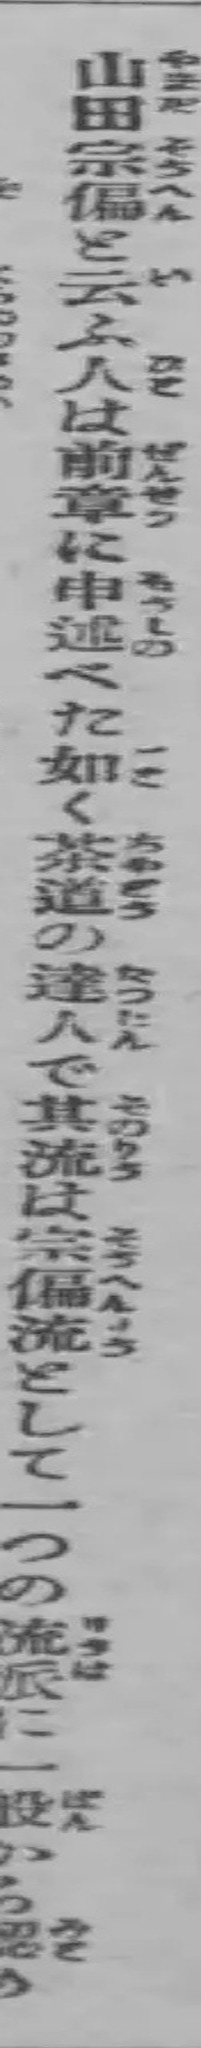山田宗偏山田宗偏と云ふ人は前章に申述べた如く茶道の達人で其流は宗偏流として一つの流派に一般から認め
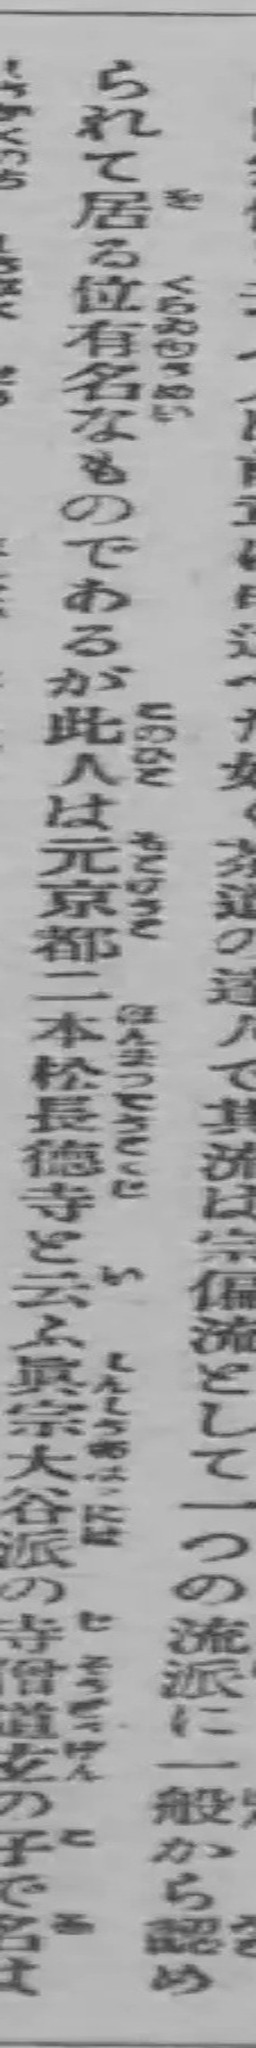られて居る位有名なものであるが此人は元京都二本松長徳寺と云ふ真宗大谷派の寺僧道玄の子で名は
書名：豊橋市史談
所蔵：国立国会図書館 National Diet Library, JAPAN
